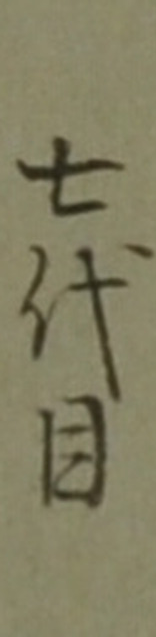七代目
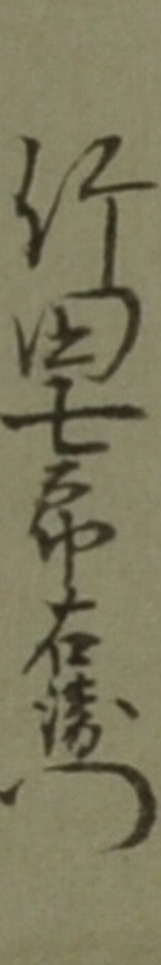竹田七郎右衛門

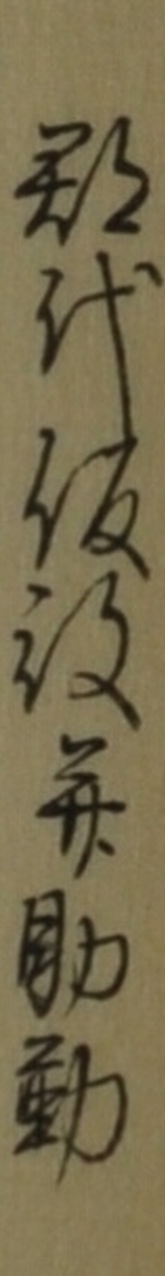郡代仮役并助勤
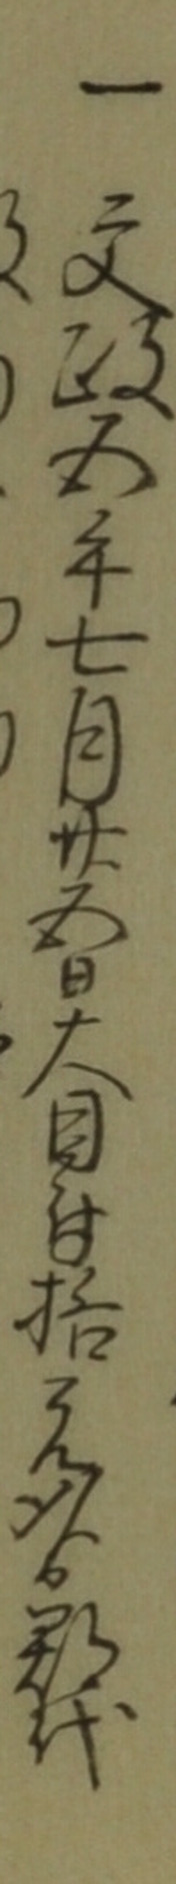一文政五午七月廿五日大目付格元〆ゟ郡代
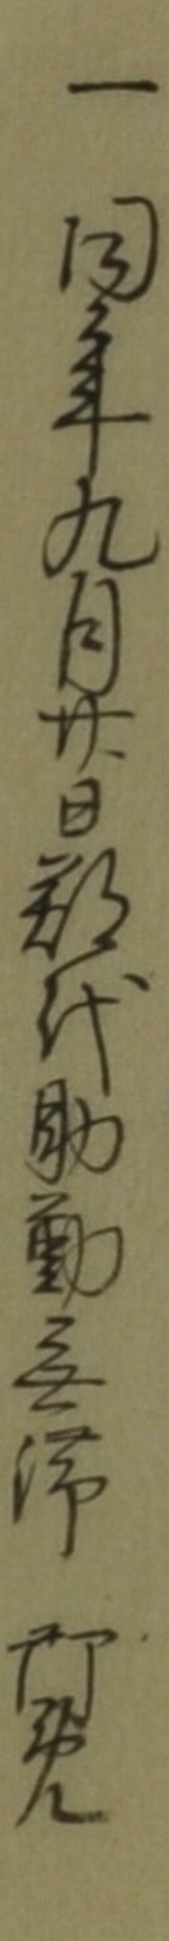一同年九月廿日郡代助勤無滞御免
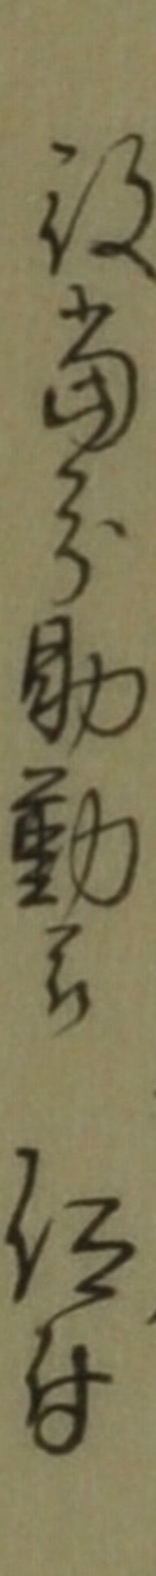役当分助勤被仰付
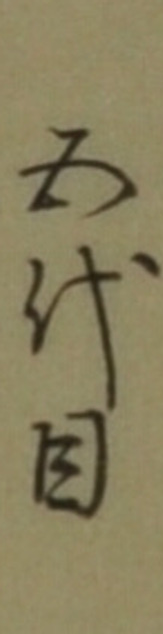五代目
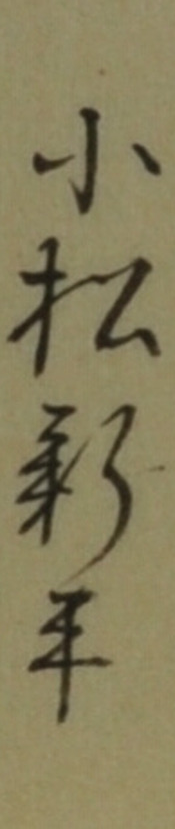小松新平

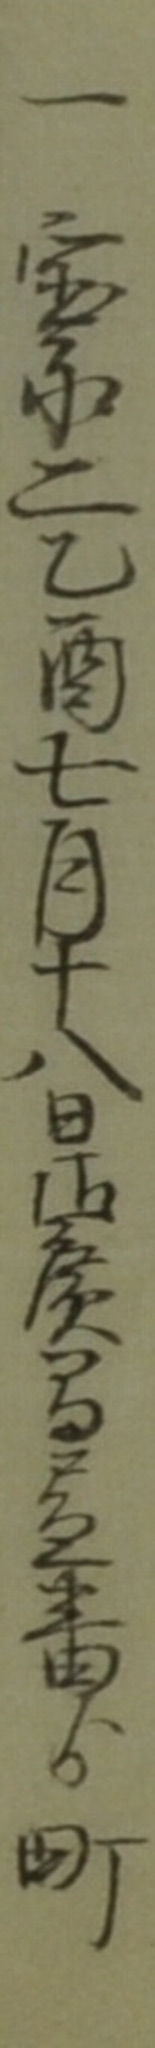一宝永二乙酉七月十八日御広間昼番ゟ町
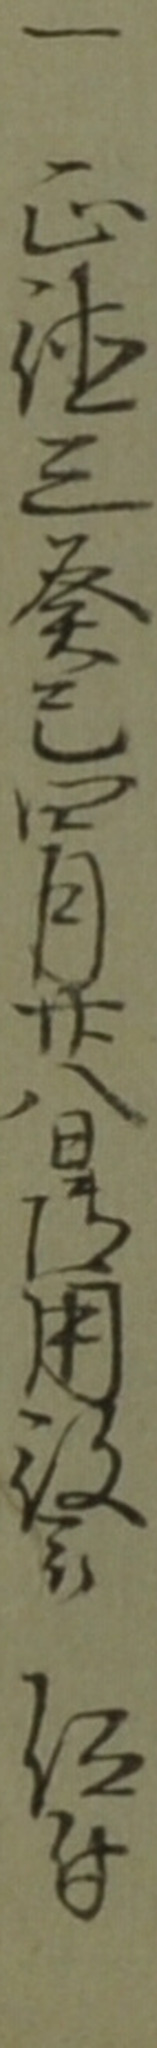一正徳三癸巳四月二十八日御用役被仰付
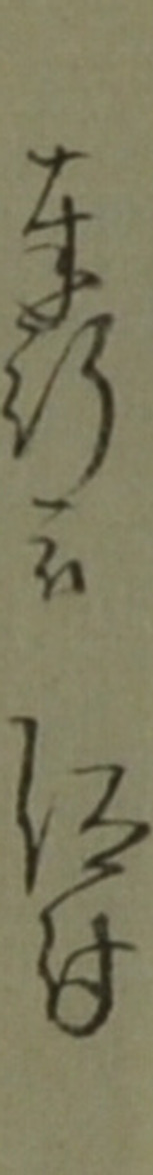奉行被仰付
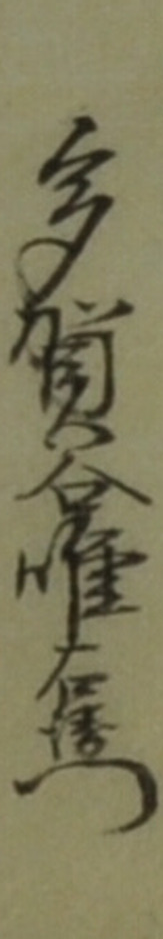多賀谷唯右衛門
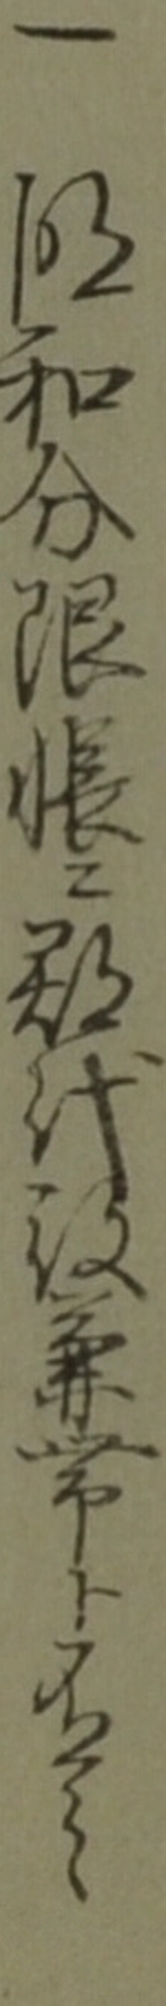一明和分限帳ニ郡代役兼帯ト有之
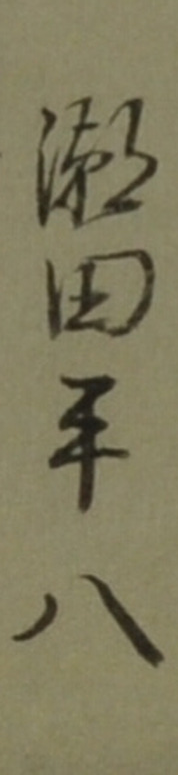瀬田平八
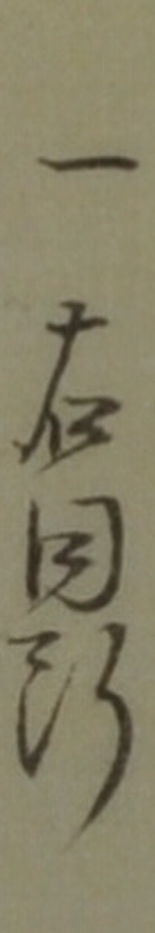一右同断
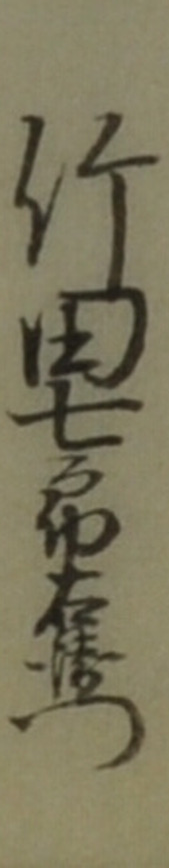竹田七郎右衛門
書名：諸御役代々録（二）
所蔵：伊那市立高遠町図書館・合同会社AMANE
